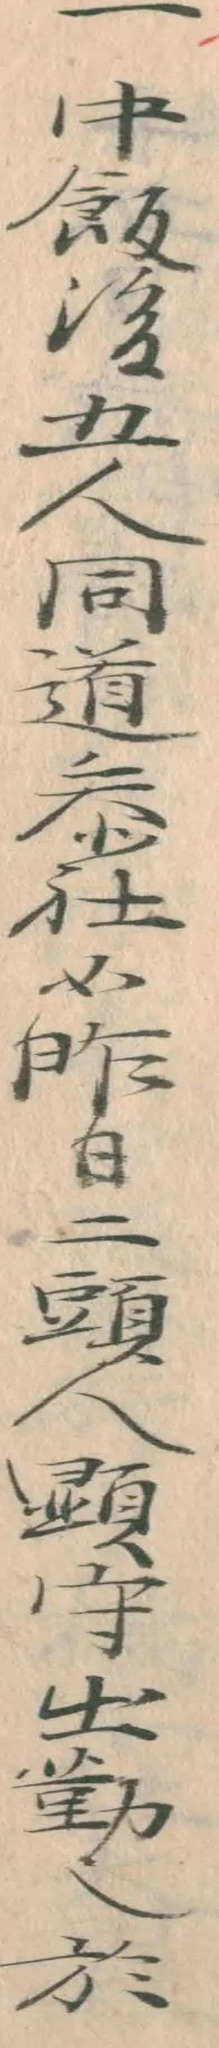一中飯後五人同道参社如昨日二頭人顕守出勤也於
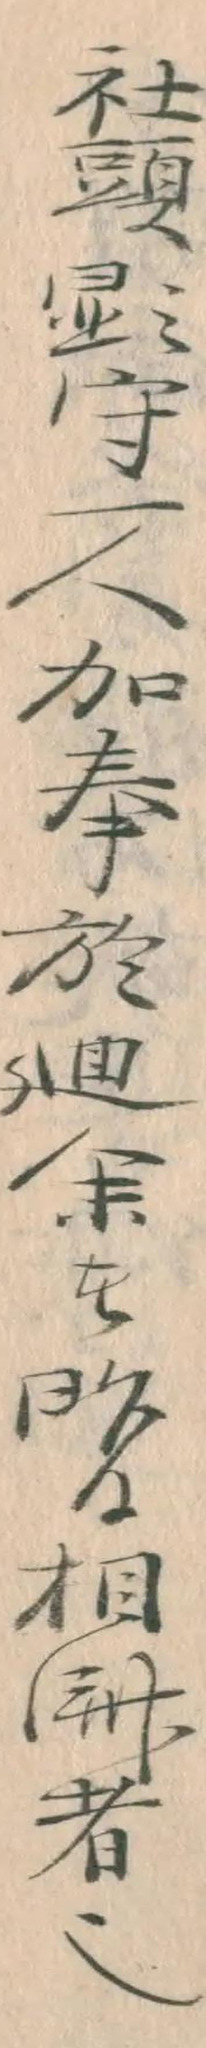社頭顕守一人加奉於廻余は跡に相済者也
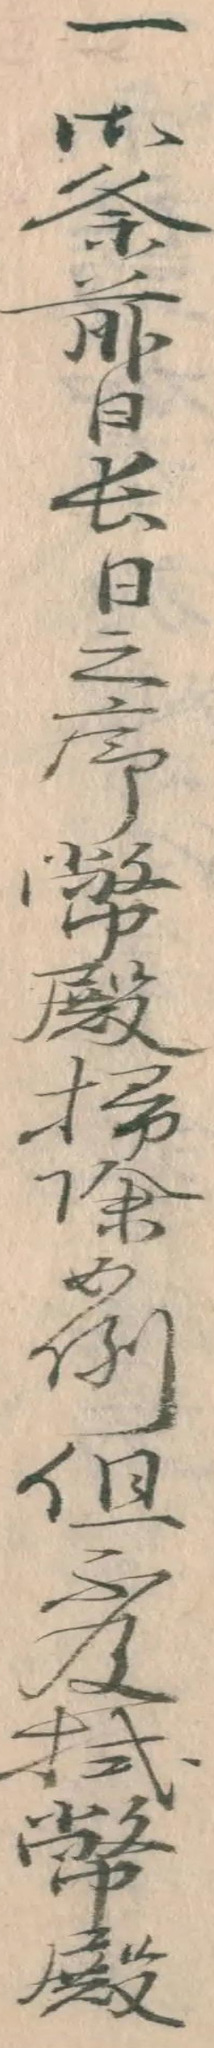一御祭前日長日之序幣殿掃除如例但不及拭幣殿
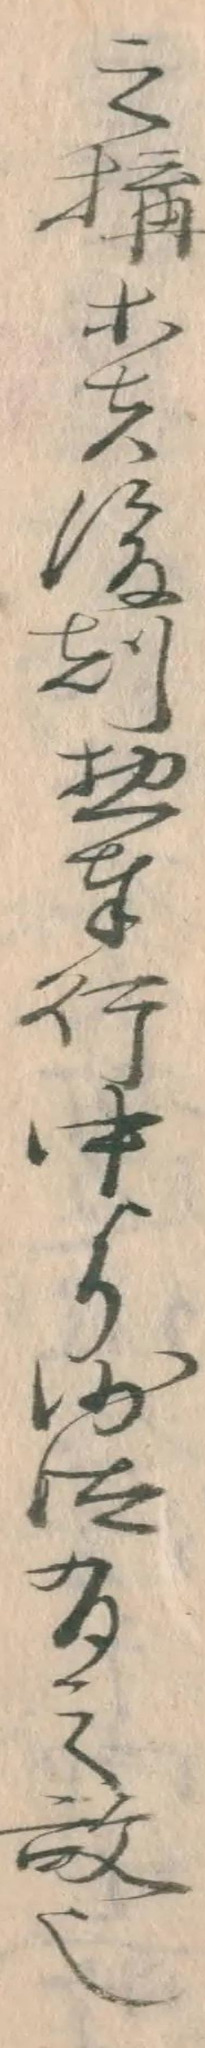之構等は後刻惣奉行中より沙汰有之故也
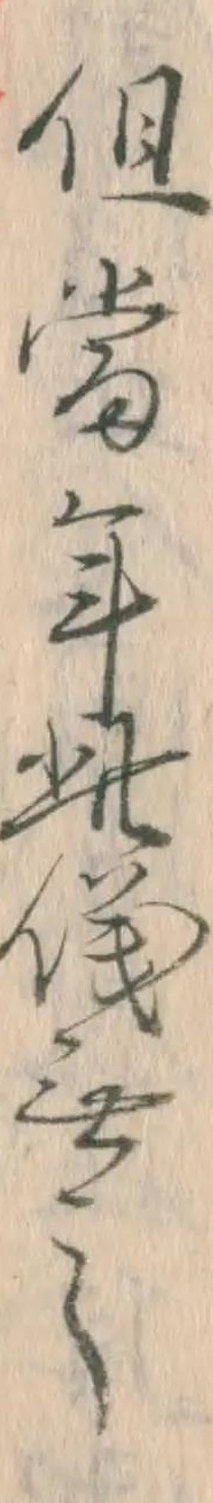但当年此儀無也
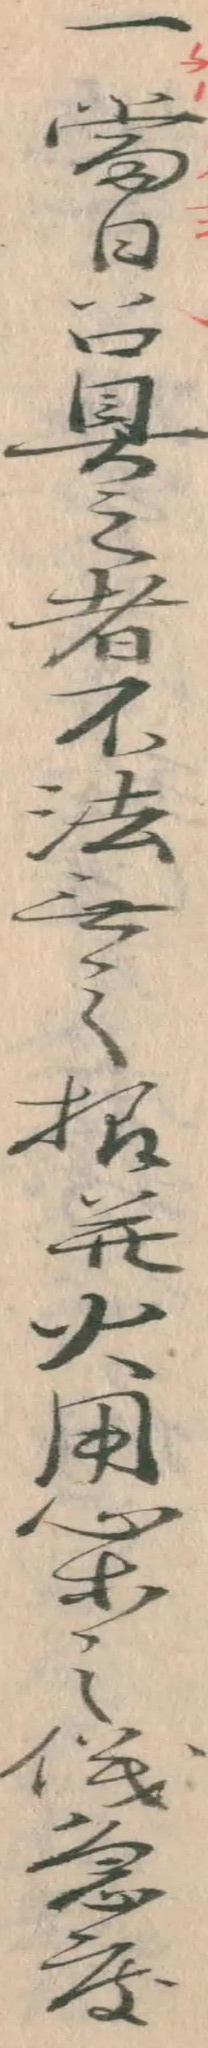一当日召具之者不法無之様并火用心等之儀急度
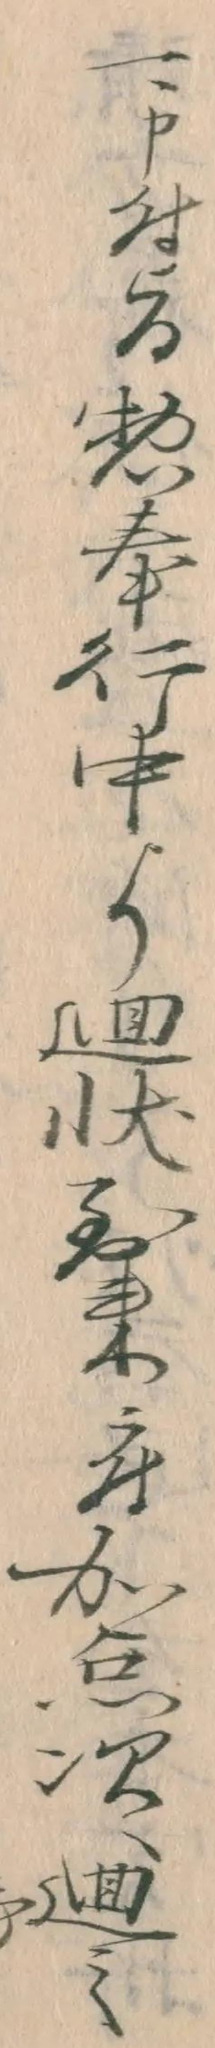可申付旨惣奉行中より廻状到来ニ付加点次へ廻之事
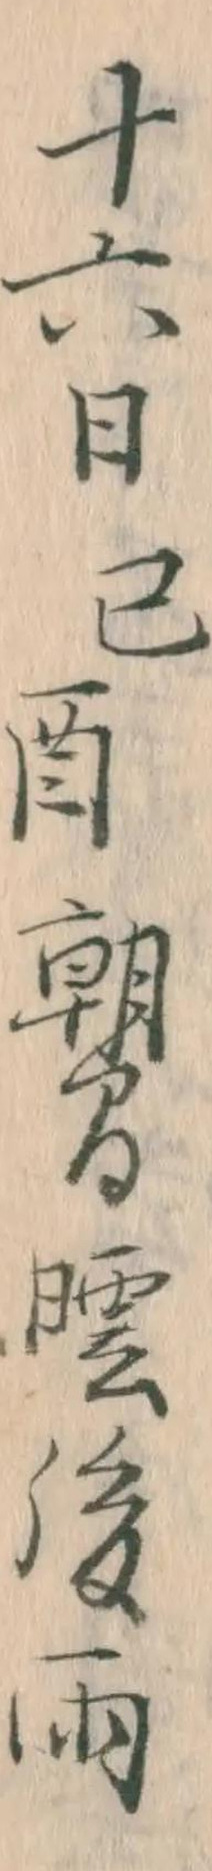十六日己酉朝間曇後雨
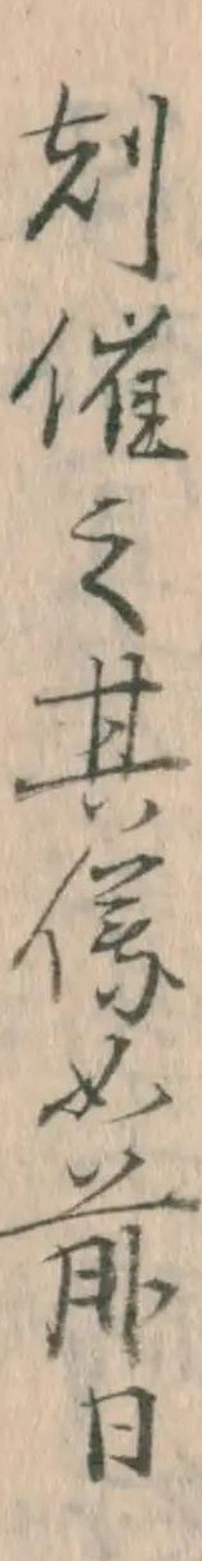刻催之其俟如前日
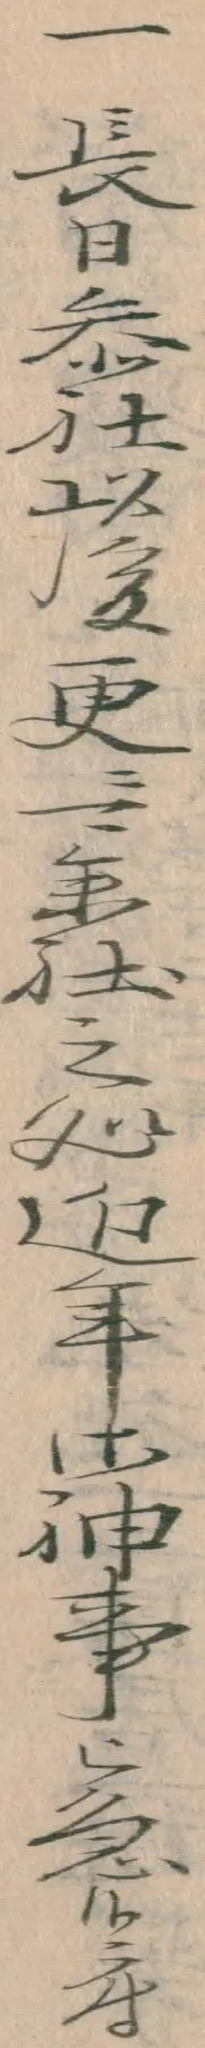一長日参社以後更ニ可参社之処近年御神事被急候ニ付
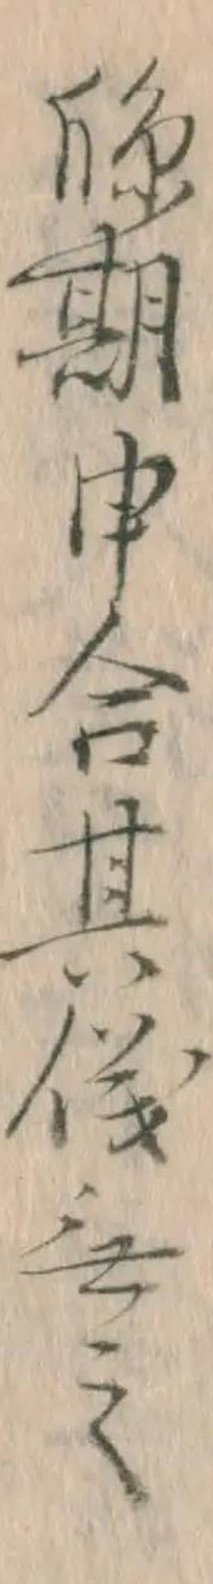臨期申合其儀無之
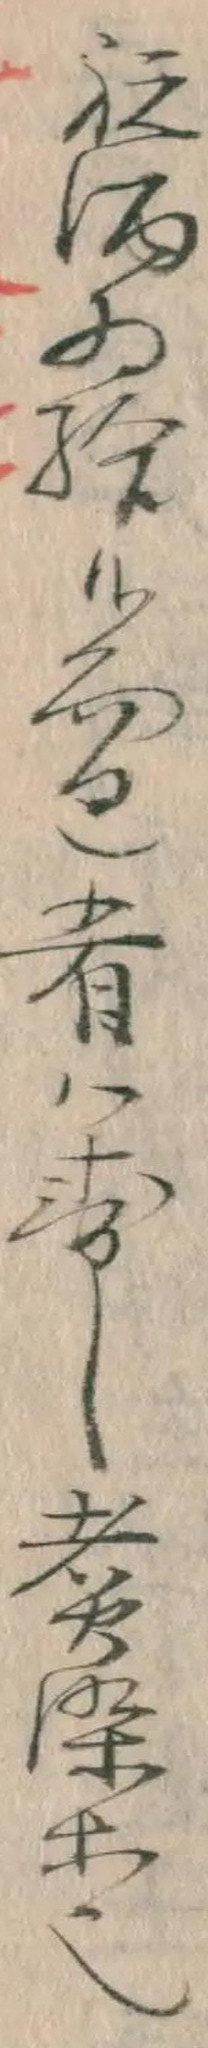祝酒為給候而包肴ハし煮染等也
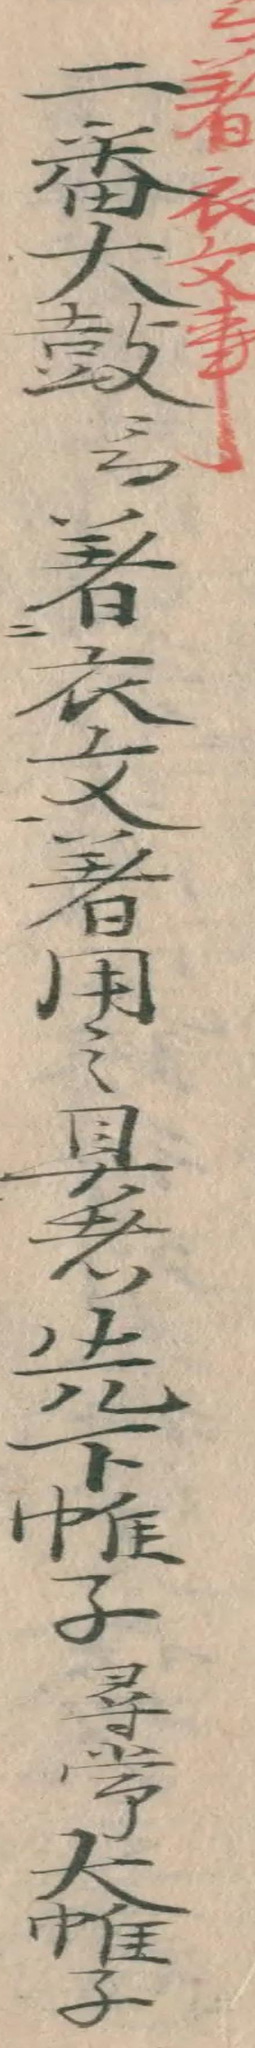一二番大鼓ニ而着衣文着用之具者先下帷子尋常大帷子
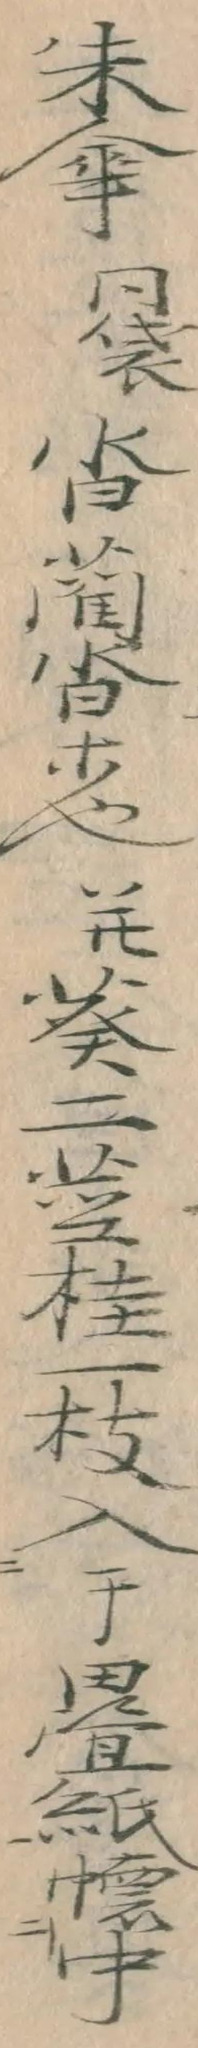朱傘同袋沓蘭沓等也并葵二茎桂一枝入干畳紙懐中

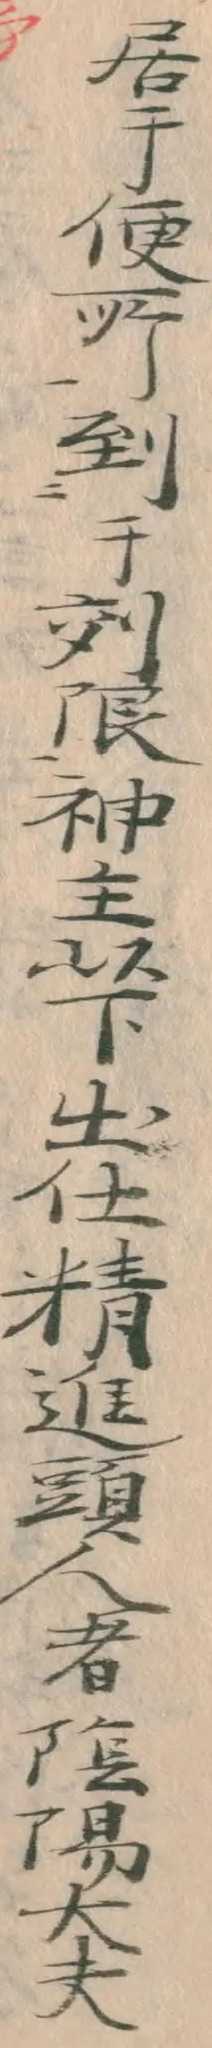居于便所到于刻限神主以下出仕精進頭人者陰陽大夫
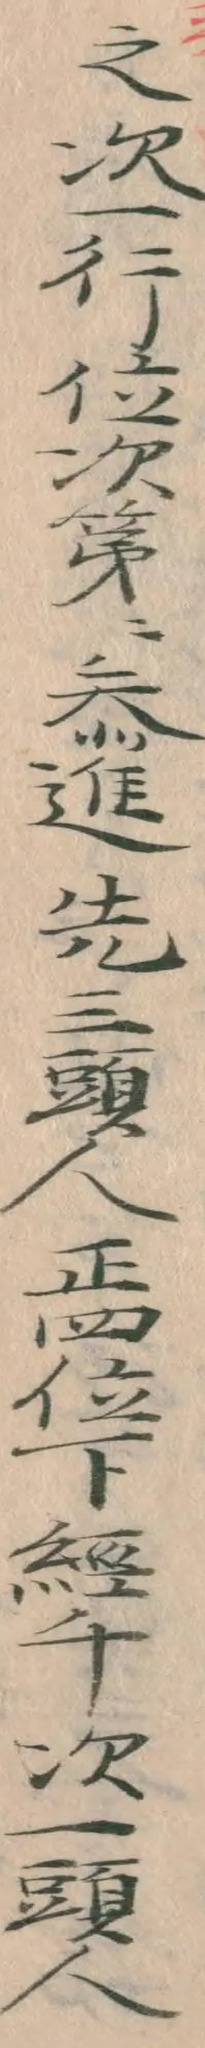之次一行位次第ニ参進先三頭人正四位下経千次一頭人
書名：賀茂社記録. 第73冊
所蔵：国立国会図書館 National Diet Library, JAPAN
